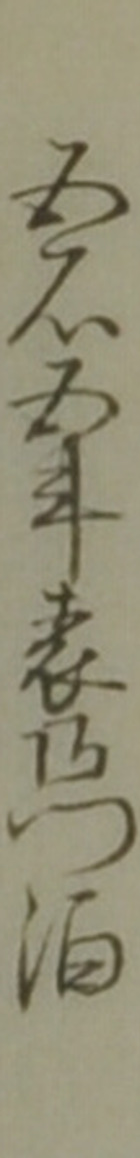五石五斗表御門泊
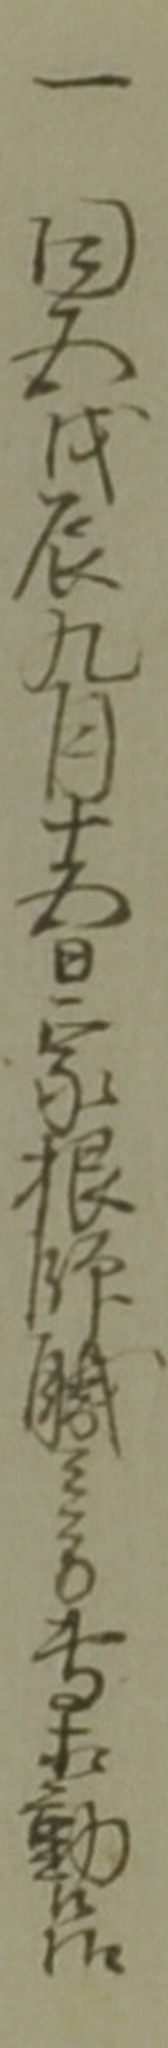一同五戌辰九月十五日家根師職之方専相勤候様
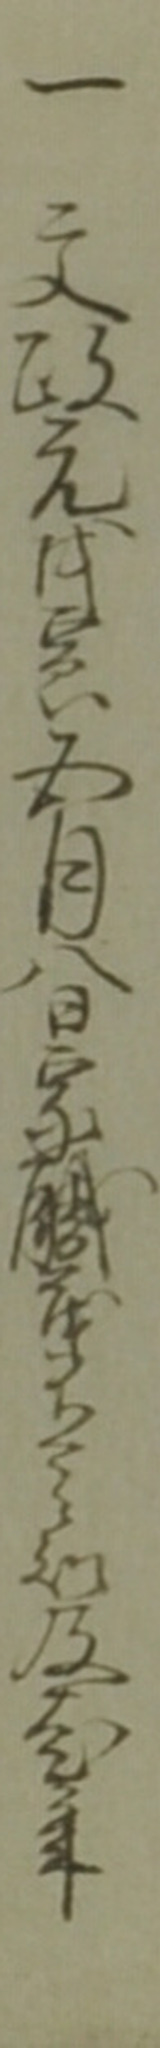一文政元戌寅五月八日家職茂有之処及老年
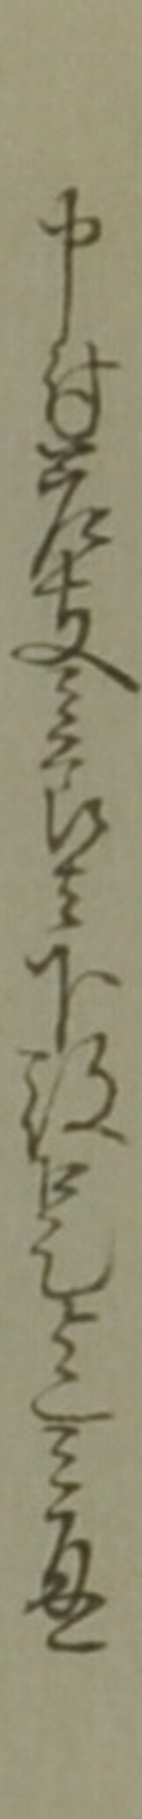申付差支之節候者下役是迄之通
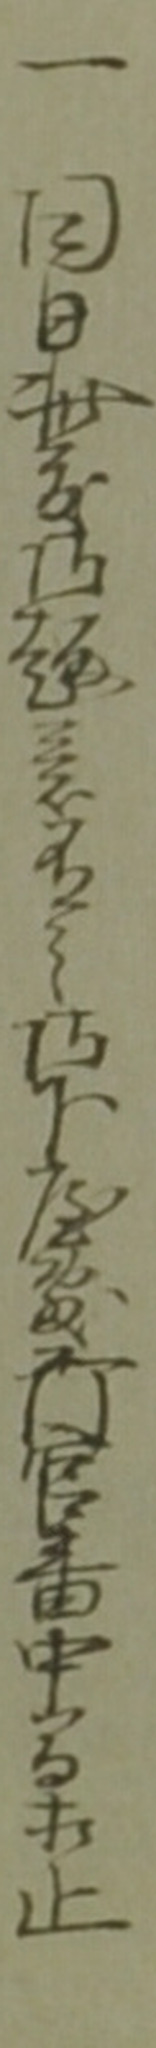一同日此度御趣意有之御下屋敷御官番中間相止
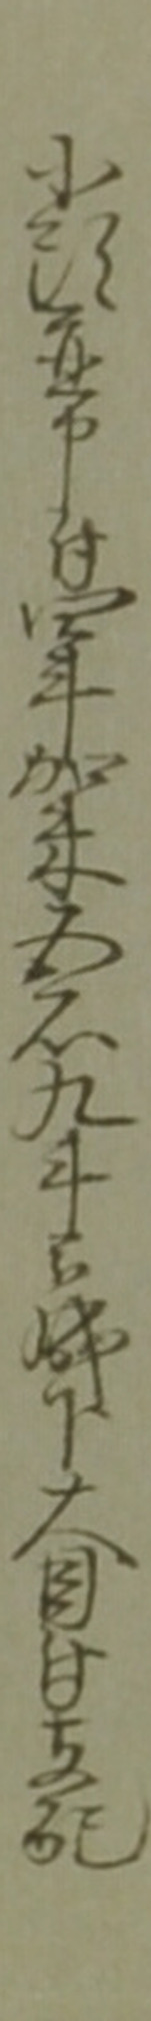小頭並申付四年加米五石九斗被成下大目付支配
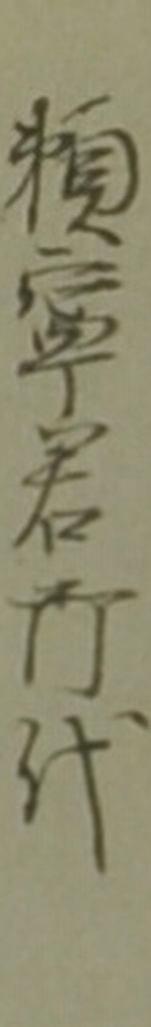頼寧君御代
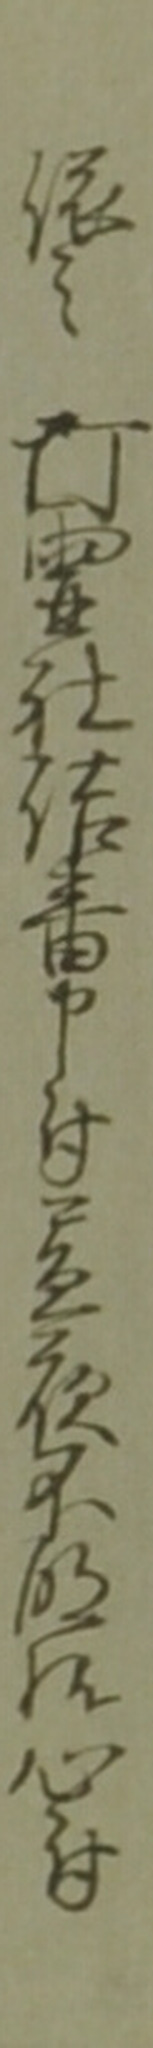依之御霊社詰番申付昼夜不明様心付
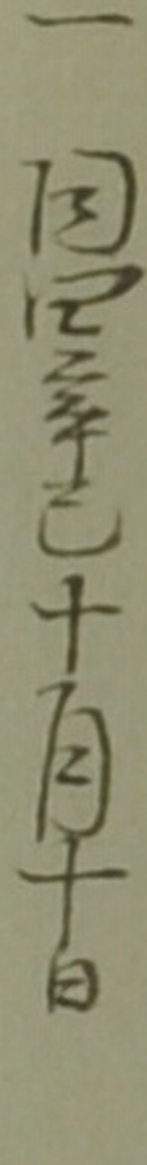一同四辛巳十月十日

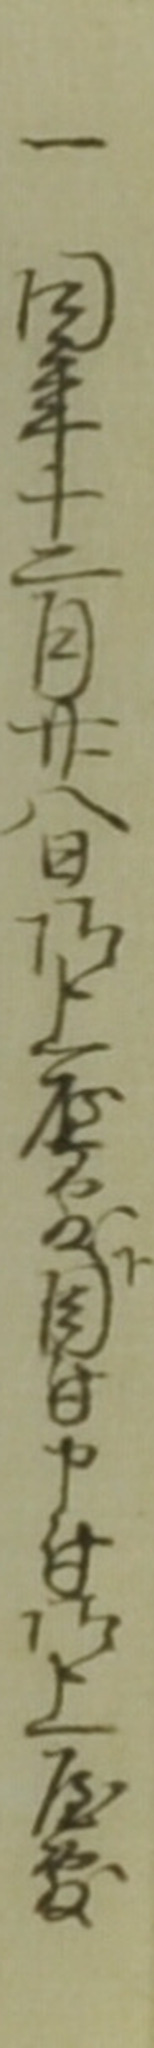一同年十二月廿八日御上屋敷目付申付御上屋敷
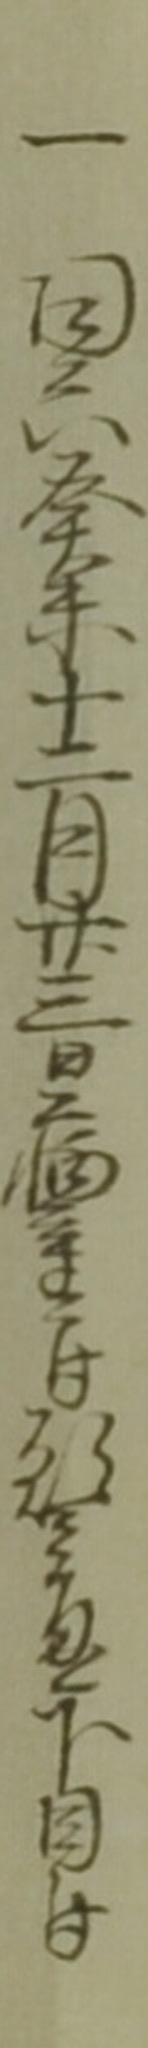一同六癸未十二月廿三日病気ニ付願之通下目付
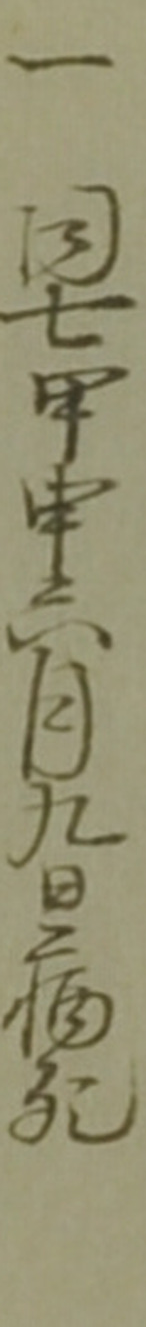一同七甲申六月九日病死
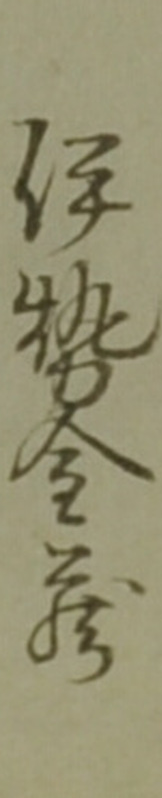伊勢金蔵
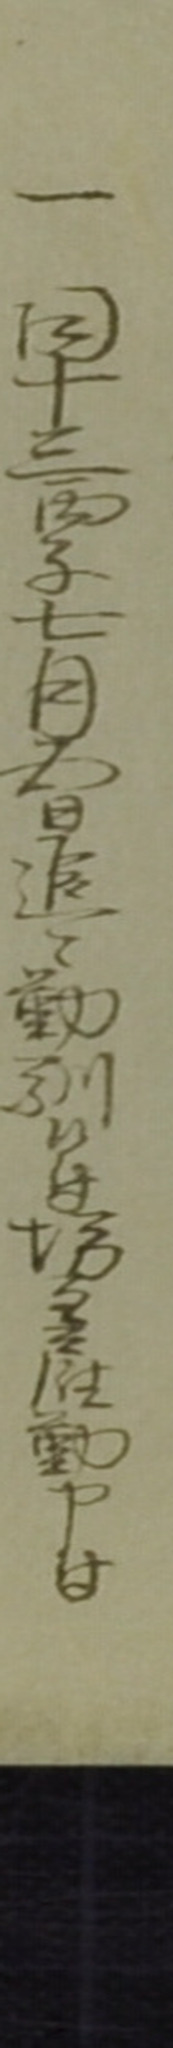一同十三丙子七月五日追々勤馴候付坊主雇勤申付
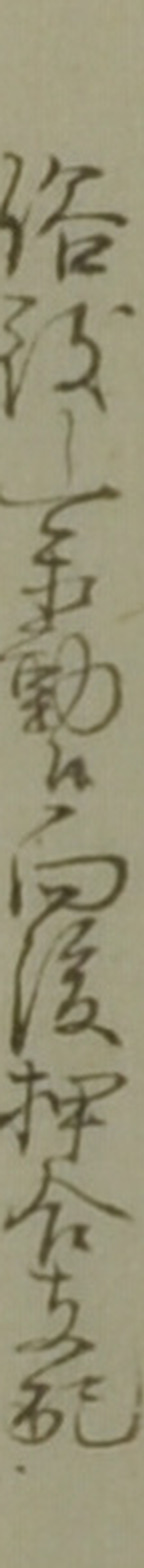俗致し可相勤候向後押合支配
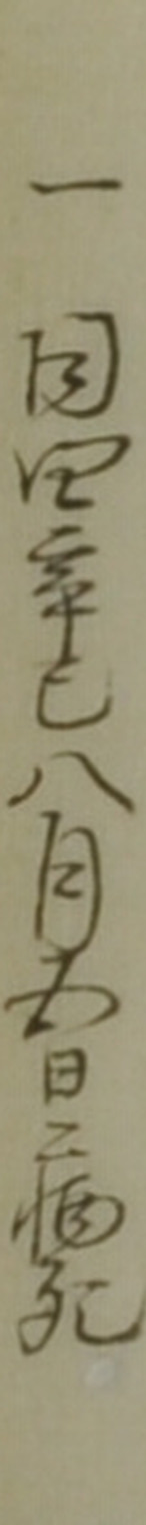一同四辛巳八月五日病死
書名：無足諸士勤仕録（八）
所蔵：伊那市立高遠町図書館・合同会社AMANE
